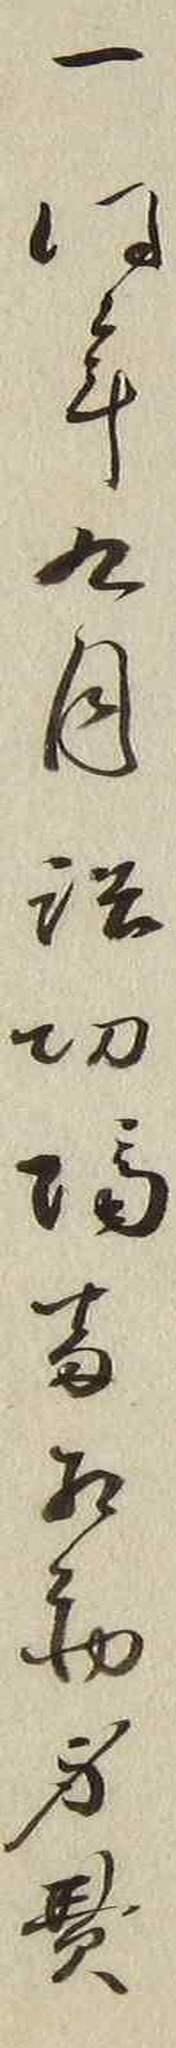一同年九月詰切隔番相勤身費
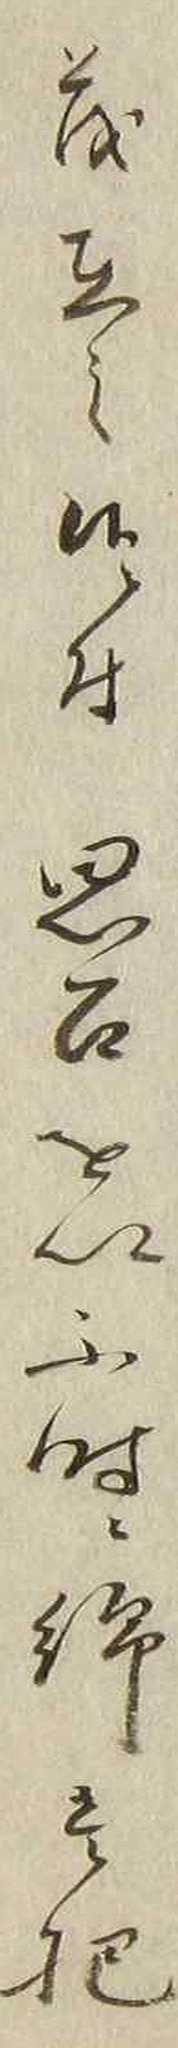茂在之候ニ付思召を以不時ニ綿壱把
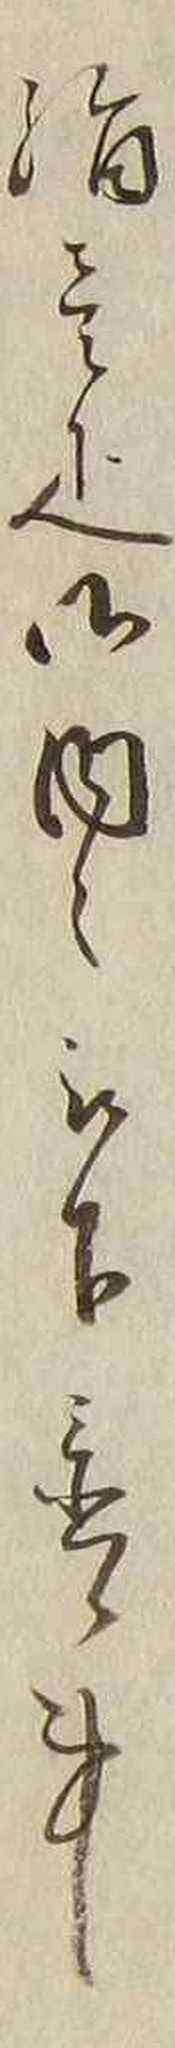絹壱疋御内々被下置候事

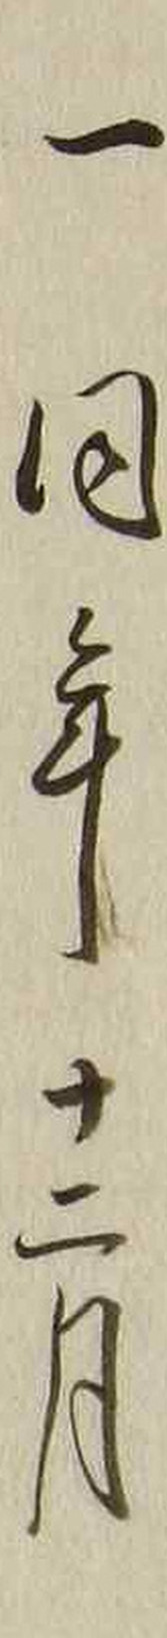一同年十二月
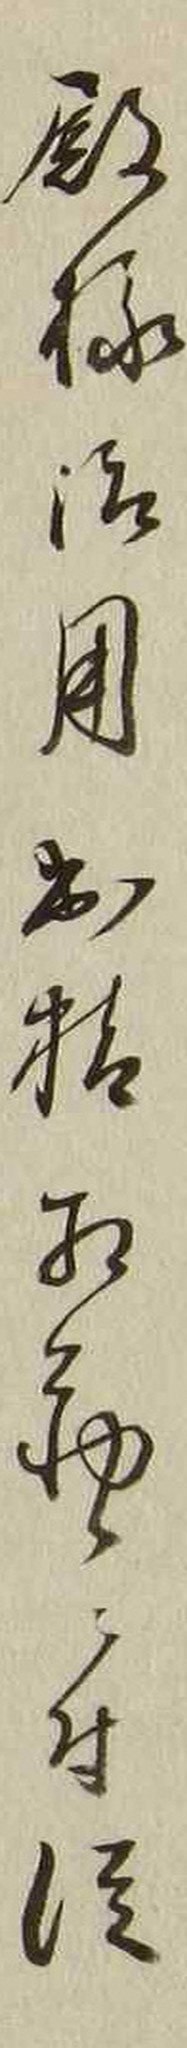殿様御用出精相勤候ニ付従
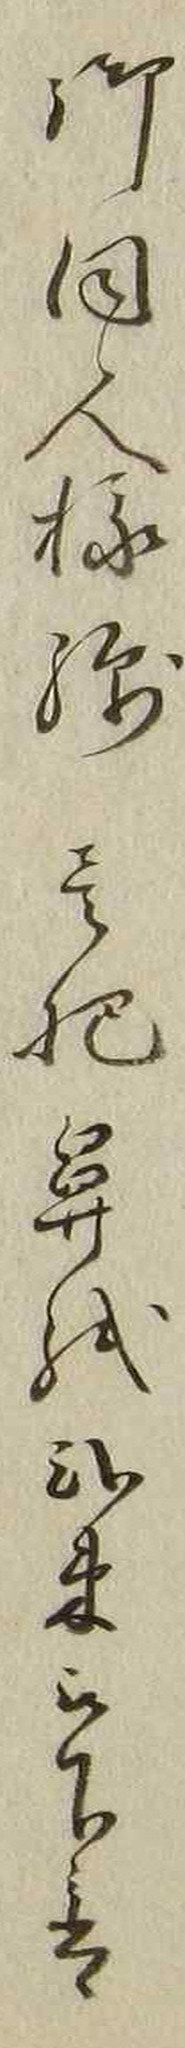御同人様綿壱把鼻紙弐束被下置候
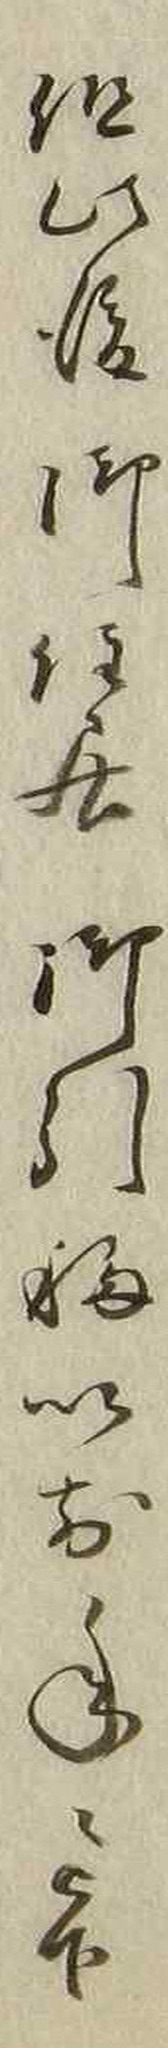但此後御住居御引移以前年々被下
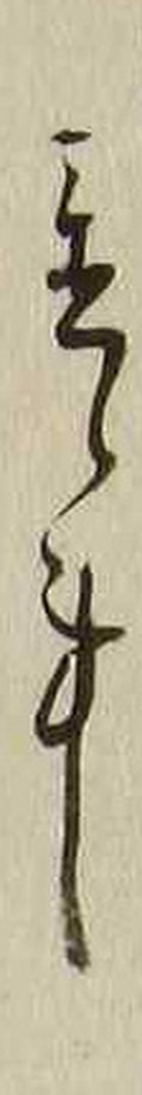置候事
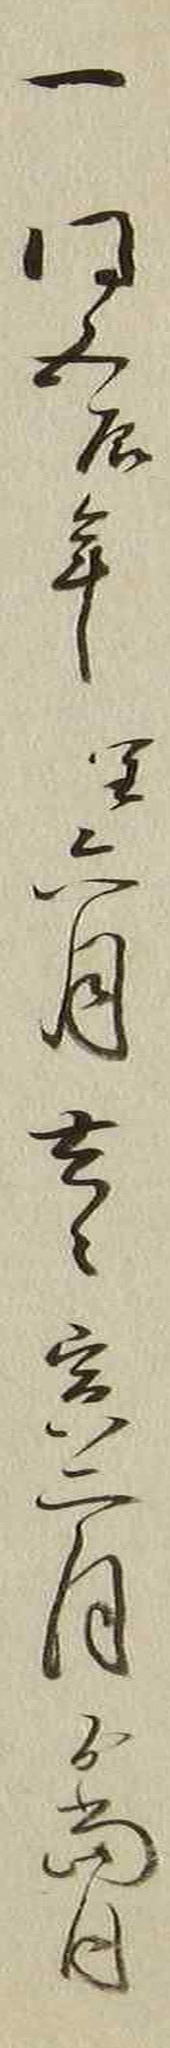一同五辰年閏六月去々寅二月ゟ当月
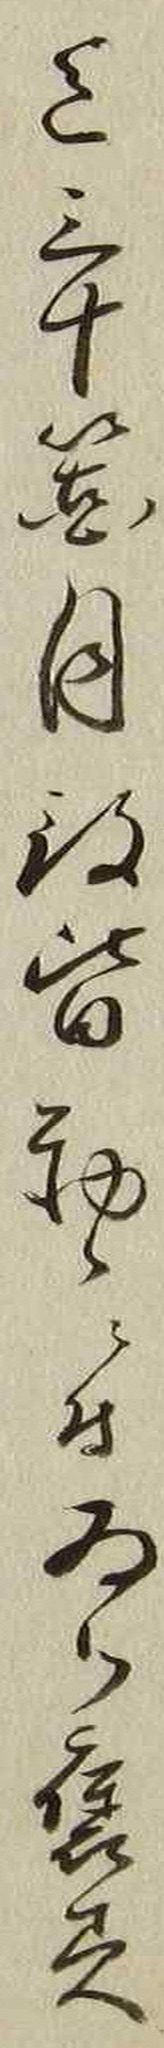迄三十箇月致皆勤候ニ付為御褒美
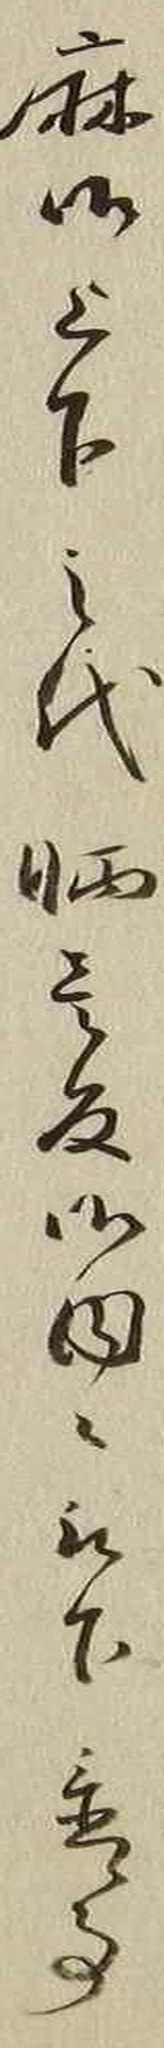麻御上下之代晒壱反御内々被下置候事
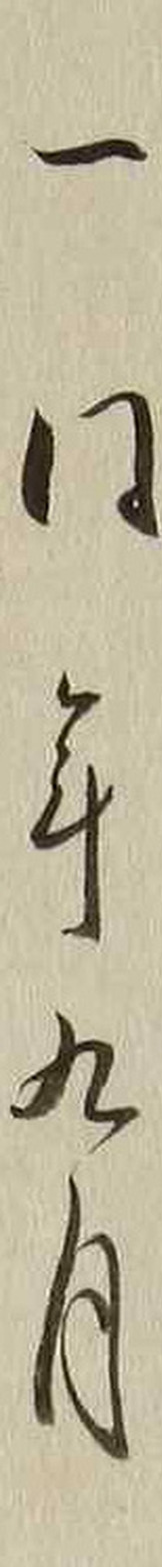一同年九月
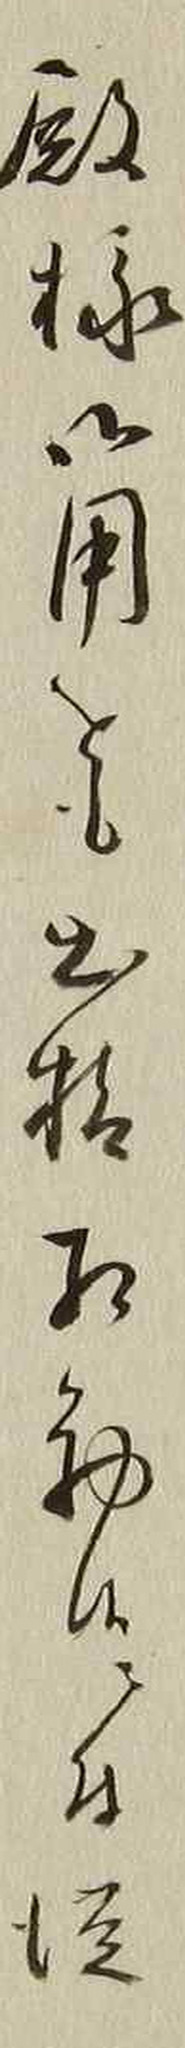殿様御用をも出精相勤候ニ付従
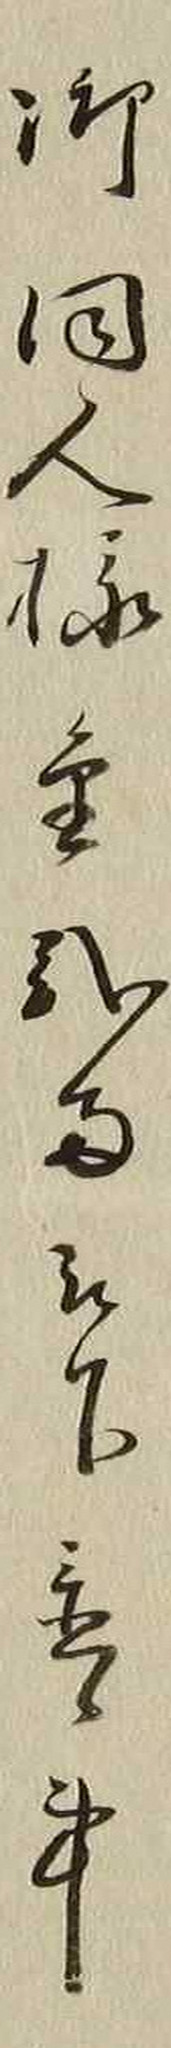御同人様金弐両被下置候事
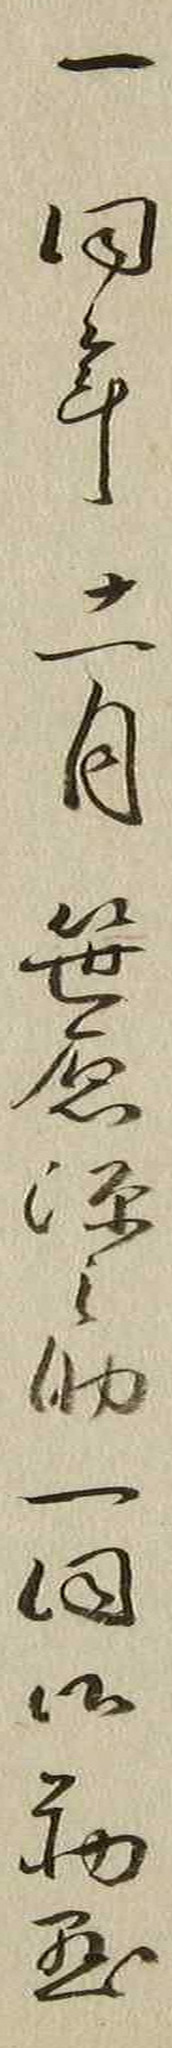一同年十一月笹原源之助一同御初懸
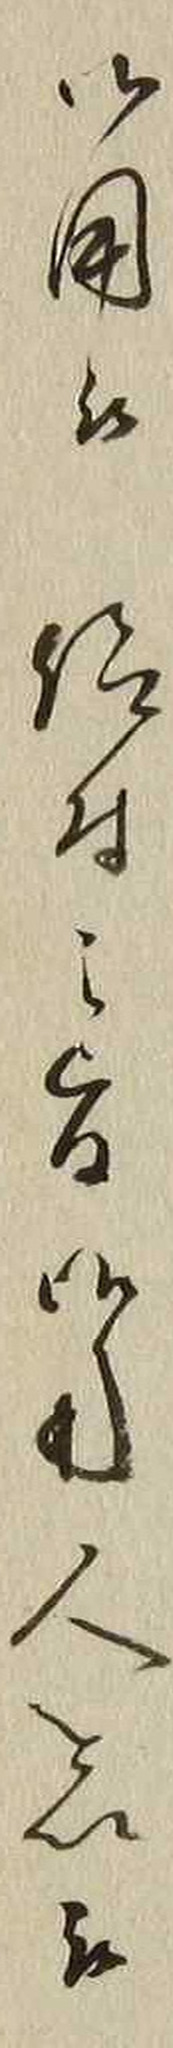御用被仰付之旨御用人を以被
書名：諸士系譜　巻之25　い之部25
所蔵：会津若松市立会津図書館
